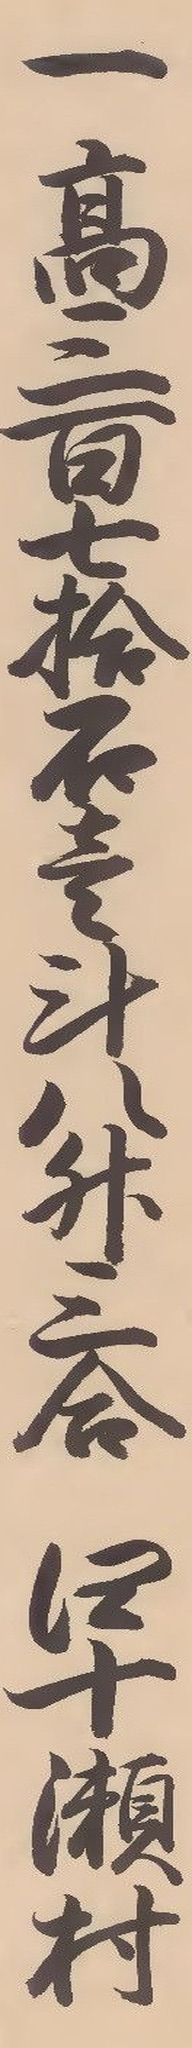一高三百七拾石壱斗八升三合四十瀬村
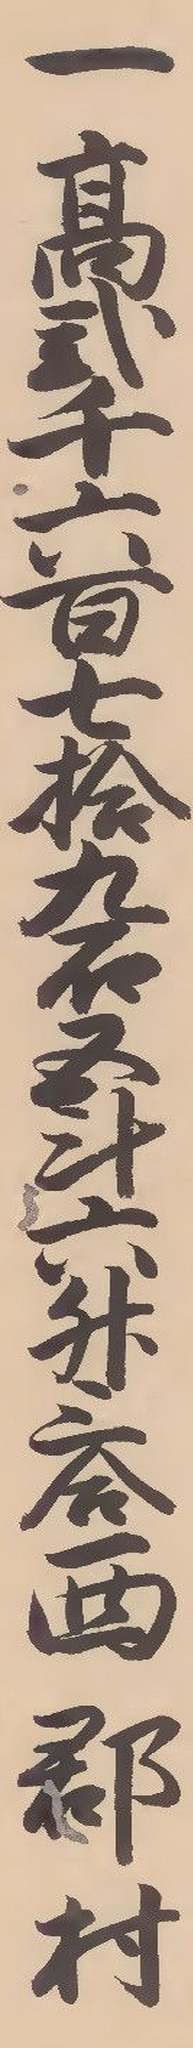一高弐千六百七拾九石五斗六升三合西郡村

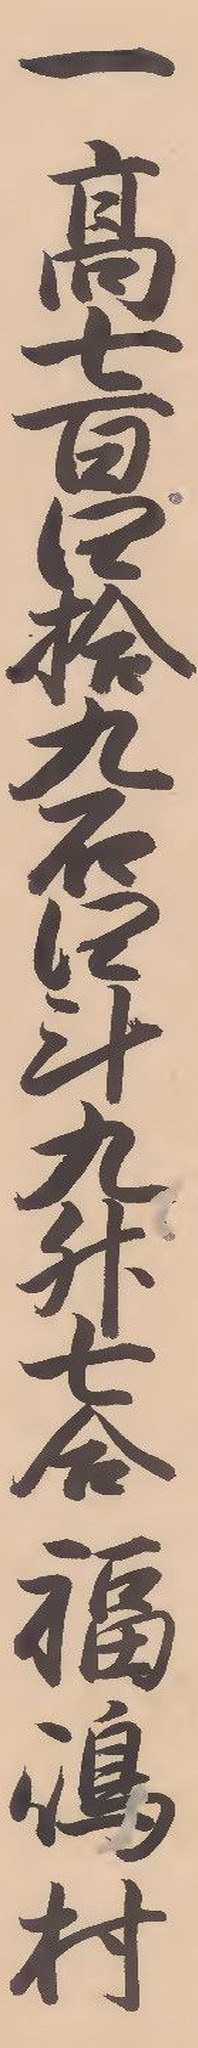一高七百四拾九石四斗九升七合福島村
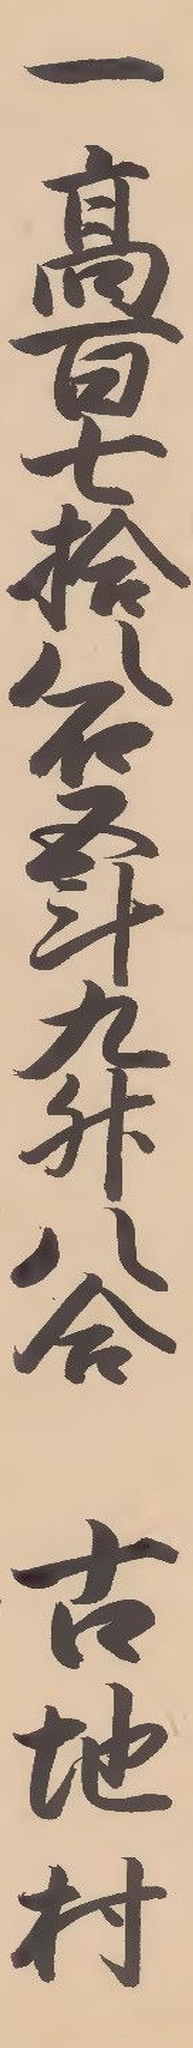一高百七拾八石五斗九升八合古地村
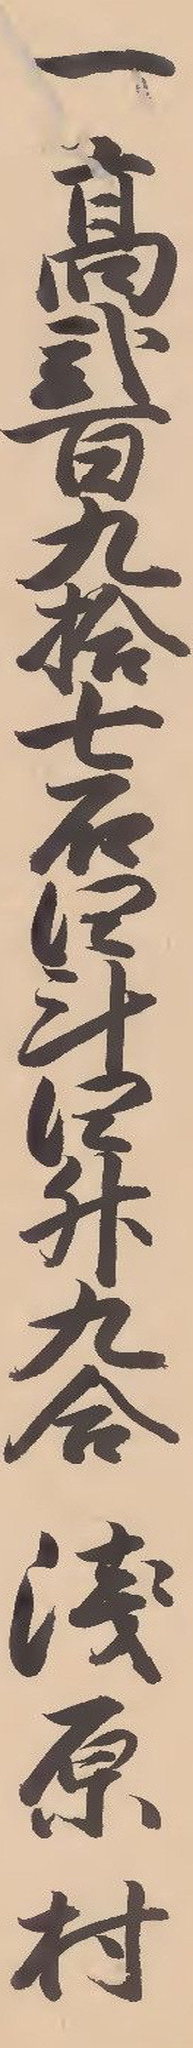一高弐百九拾七石四斗四升九合浅原村
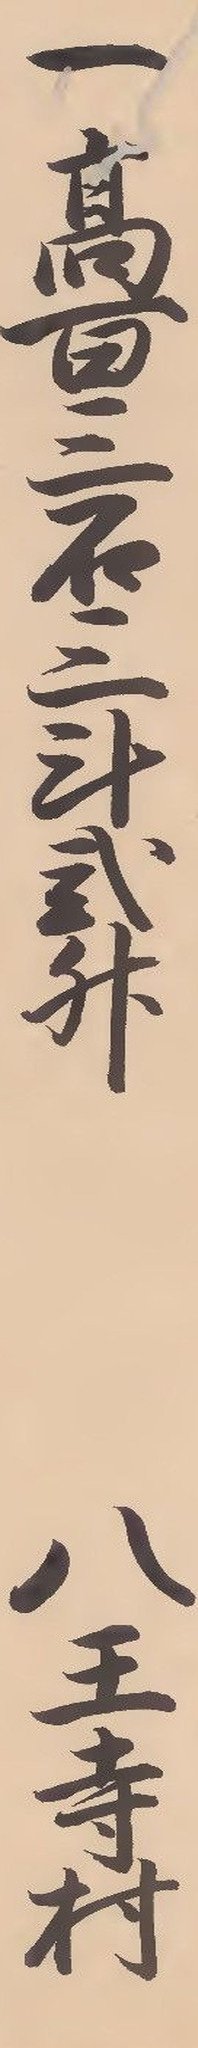一高百三石三斗弐升八王寺村
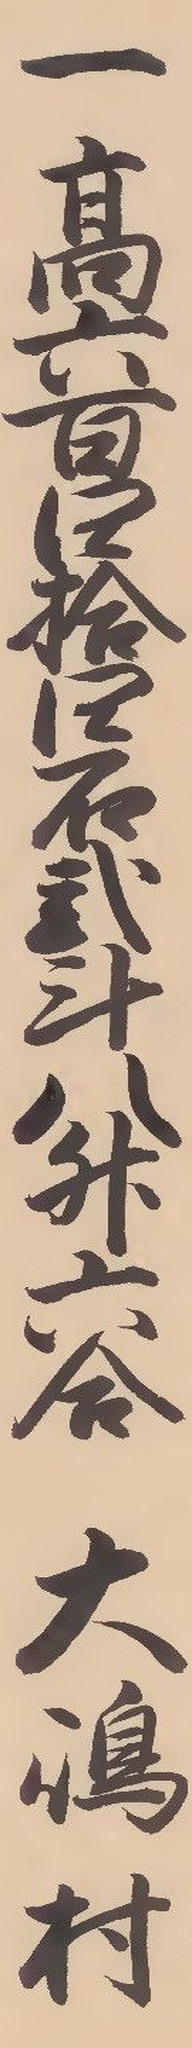一高六百四拾四石弐斗八升六合大島村
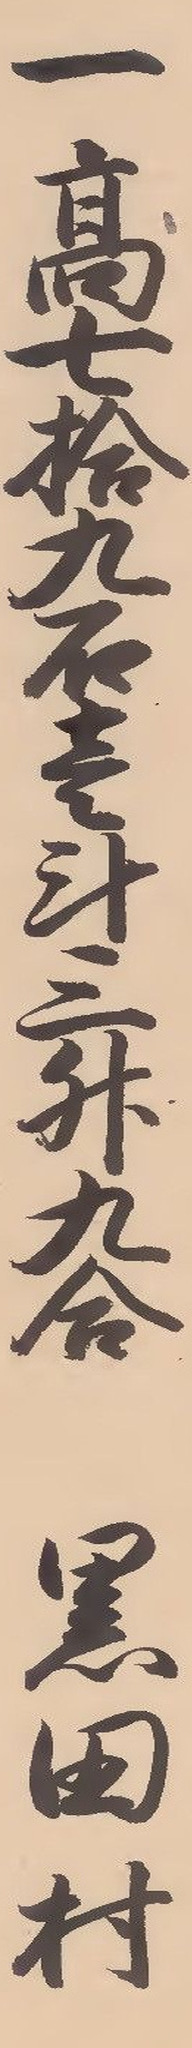一高七拾九石壱斗三升九合黒田村
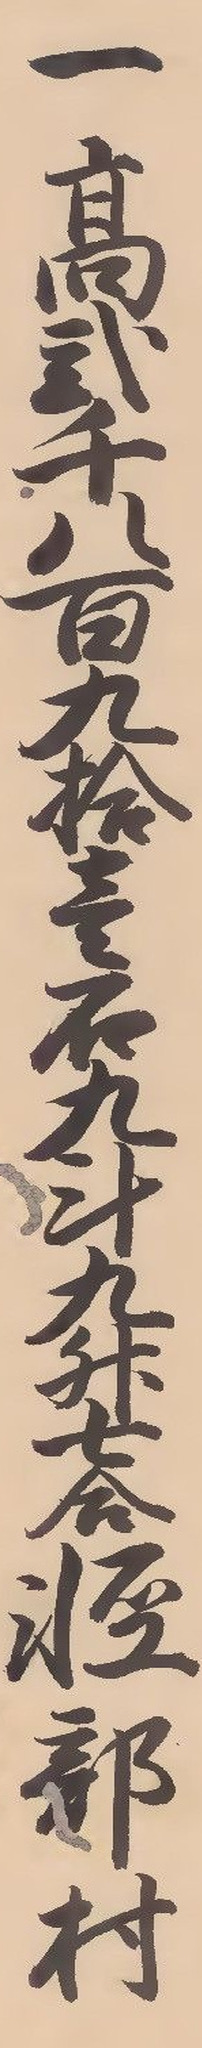一高弐千八百九拾壱石九斗九升七合軽部村

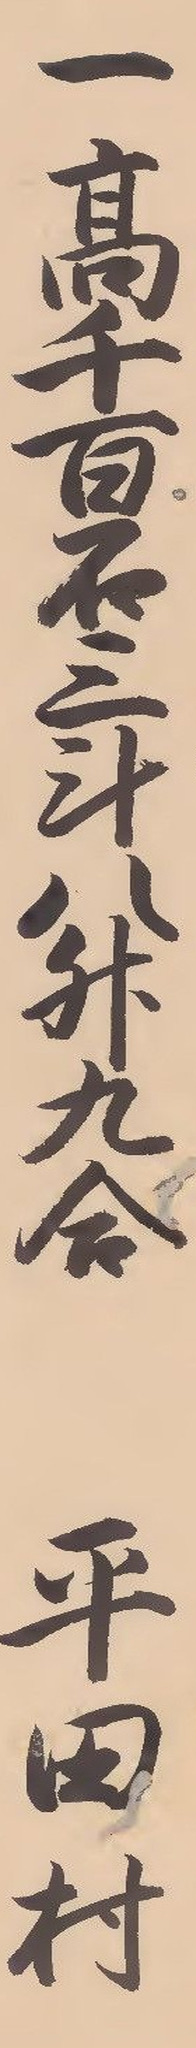一高千百石三斗八升九合平田村
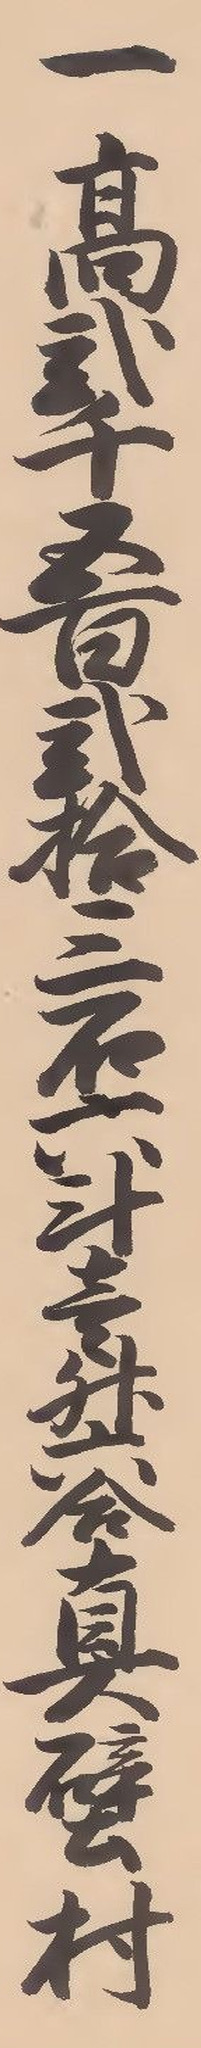一高弐千五百弐拾三石六斗壱升六合真壁村
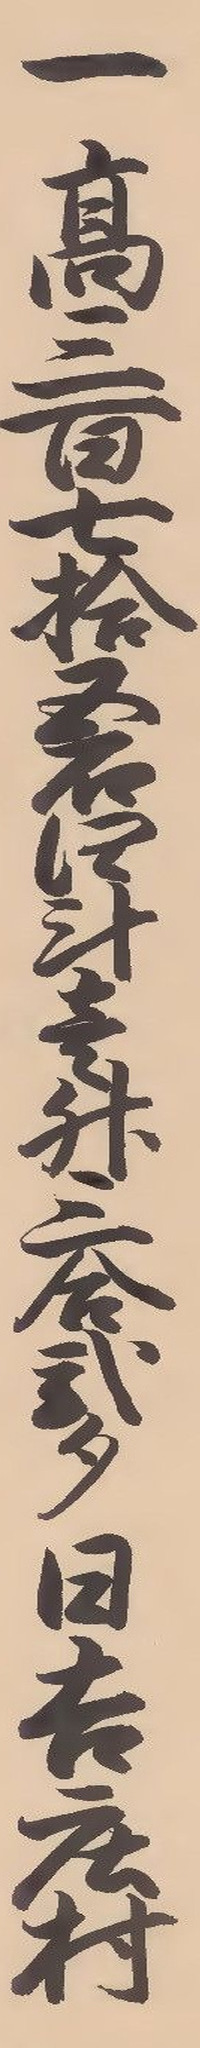一高三百七拾五石四斗壱升三合弐勺日吉庄村
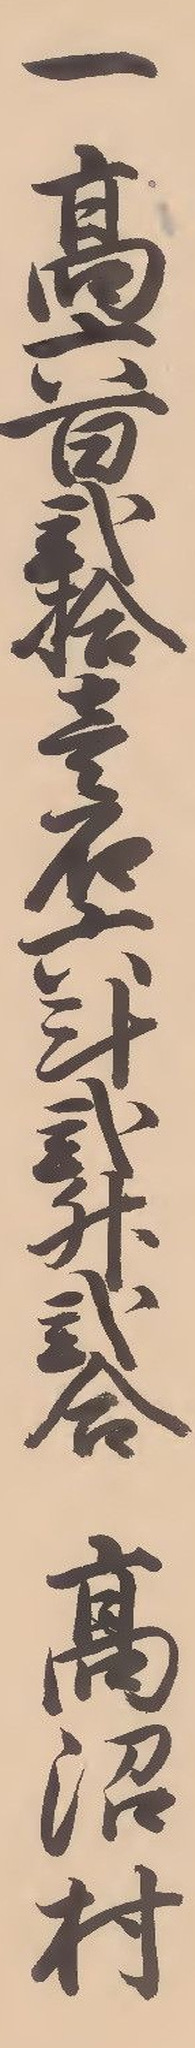一高六百弐拾壱石六斗弐升弐合高沼村
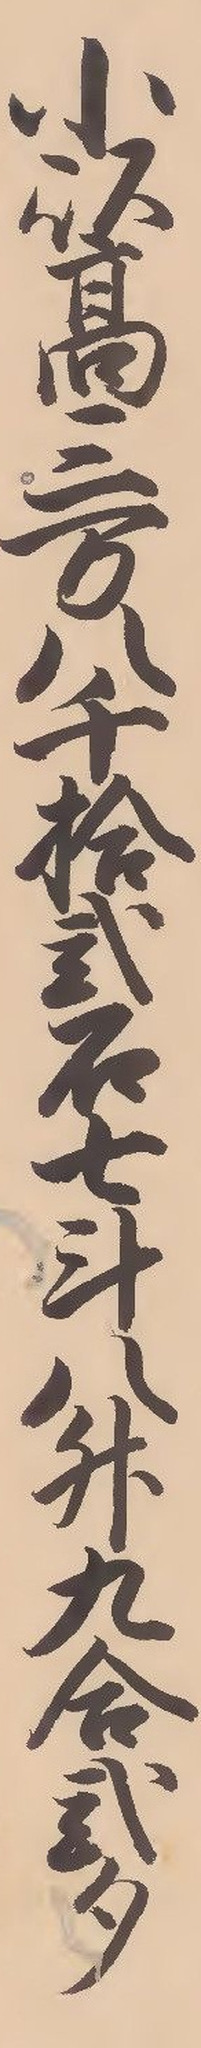小以高三万八千拾弐石七斗八升九合弐勺

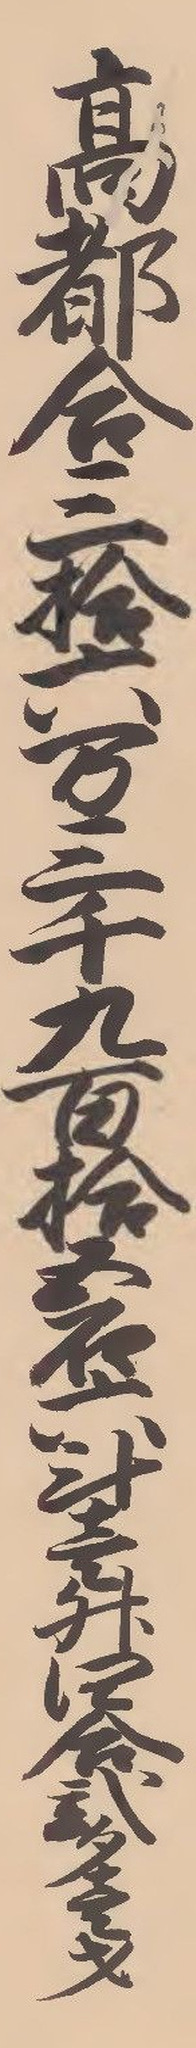高都合三拾六万三千九百拾五石六斗壱升四合弐勺壱才
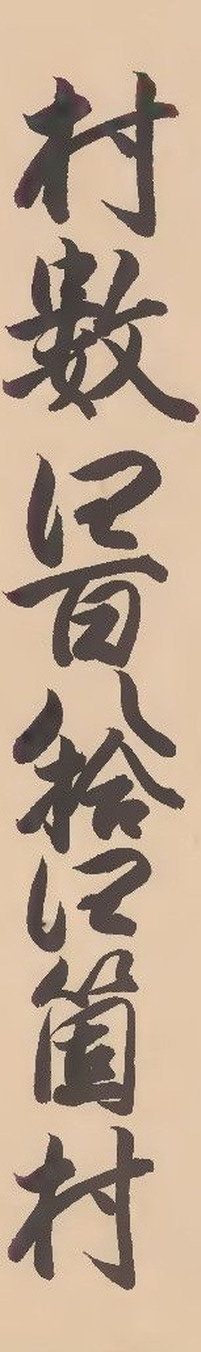村数四百八拾四箇村
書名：備中国郷帳
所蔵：国立公文書館 National Archives of Japan
